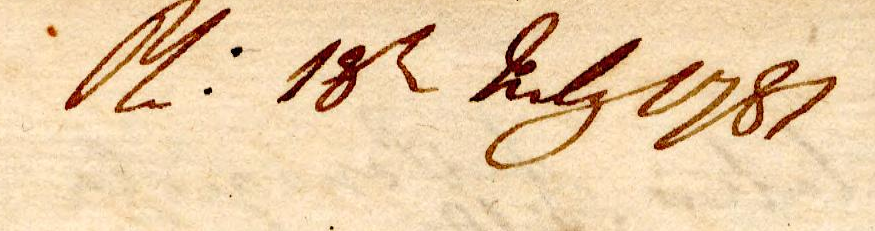Phi: 18^th July 1781
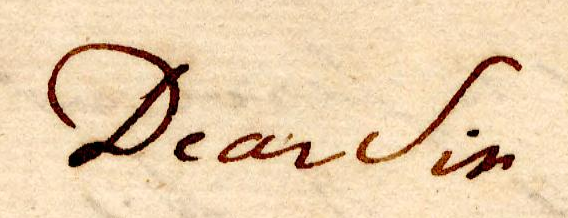Dear Sir
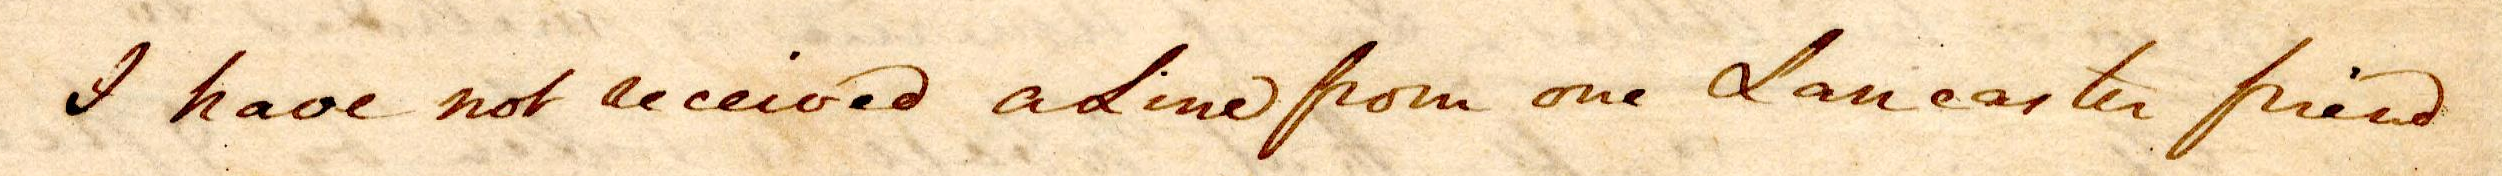I have not received a Line from one Lancaster friend
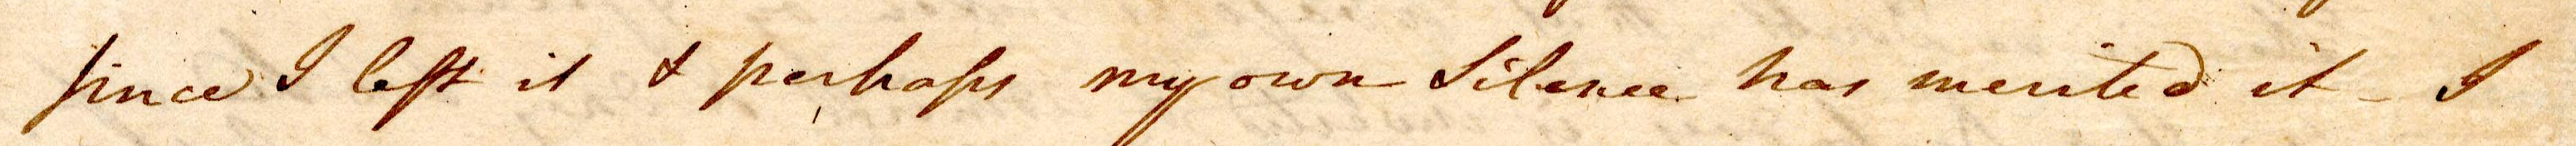since I left it & perhaps my own Silence has merited it I
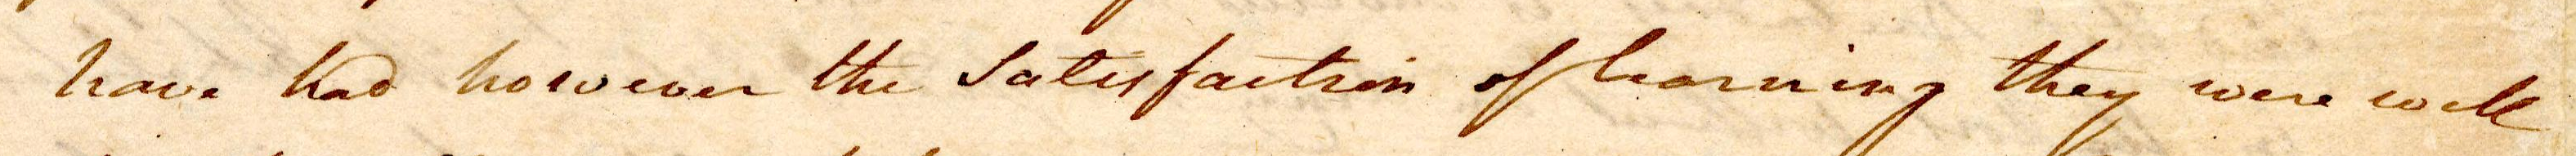have had however the Satisfaction of learning they were well
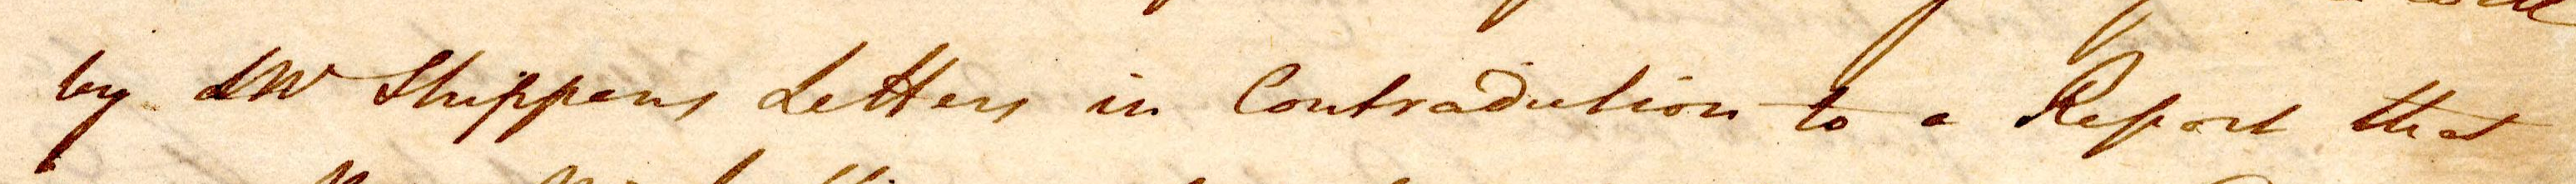by M^r Shippens Letters in Contradiction to a Report that
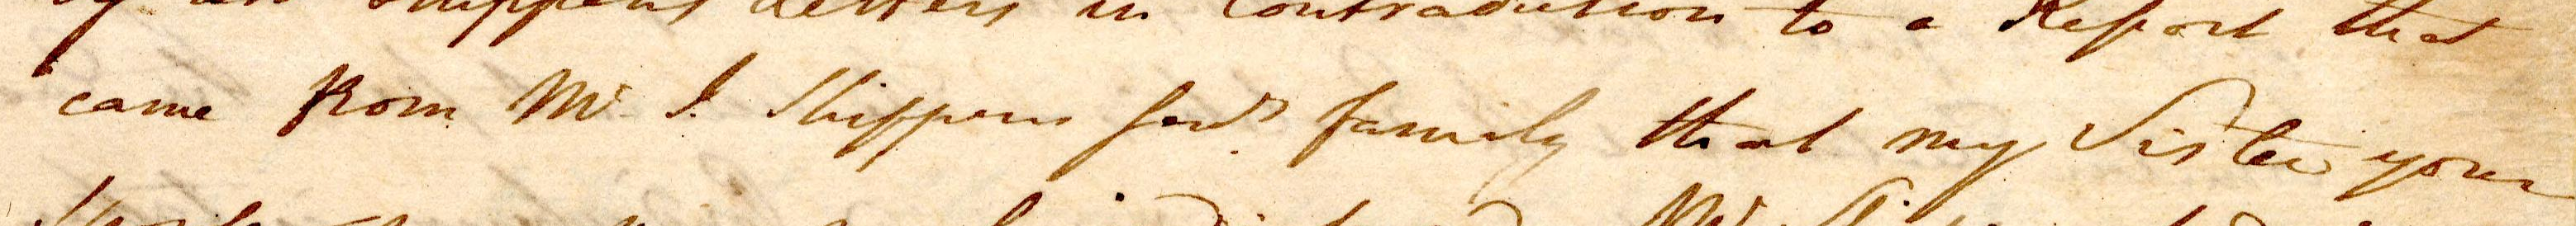came from M^r J. Shippens fav^r. family that my Sister your
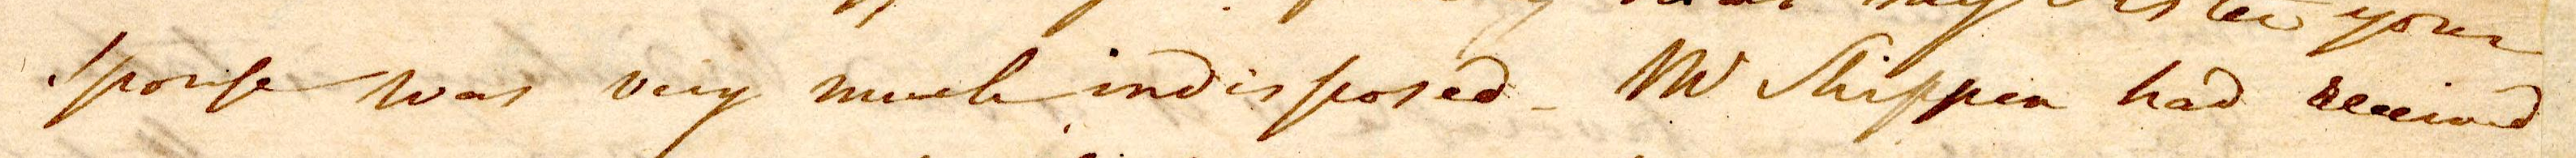spouse was very much indisposed. M^r Shippen had received
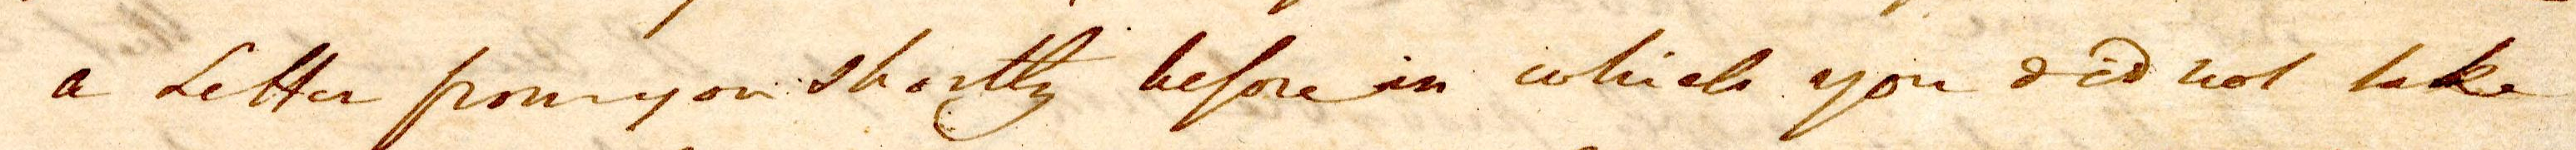a Letter from you shortly before in which you did not like
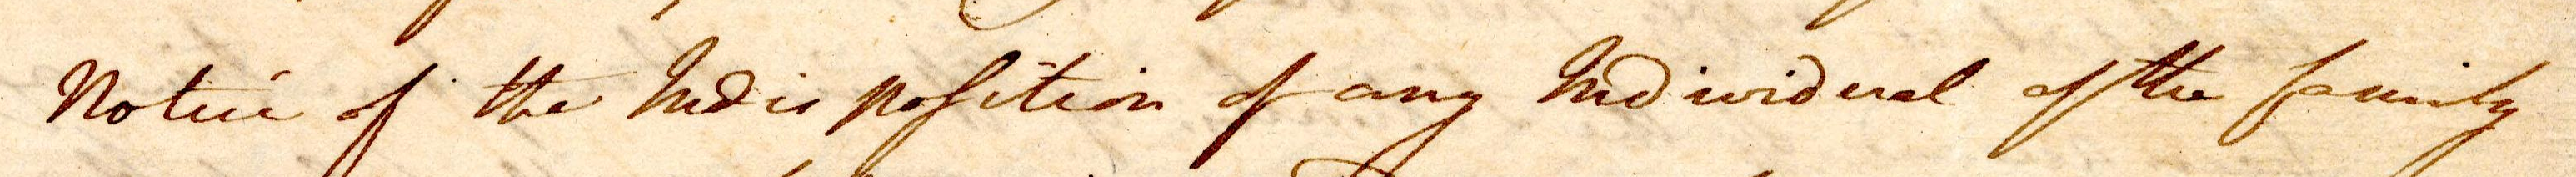Notice of the Indisposition of any Individual of the family
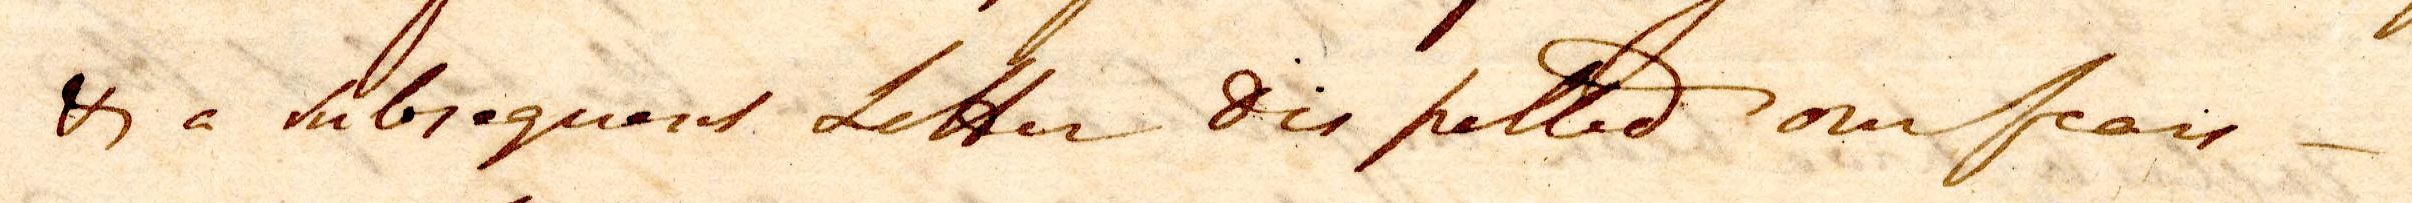& a subsequent Letter dispelled our fears.
